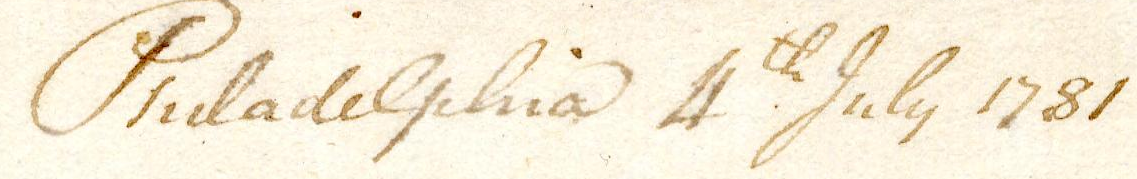Philadelphia 4^th July 1781
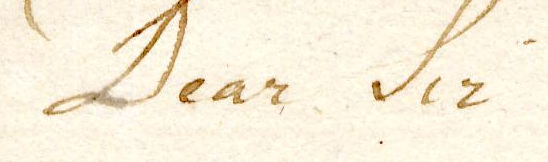Dear Sir
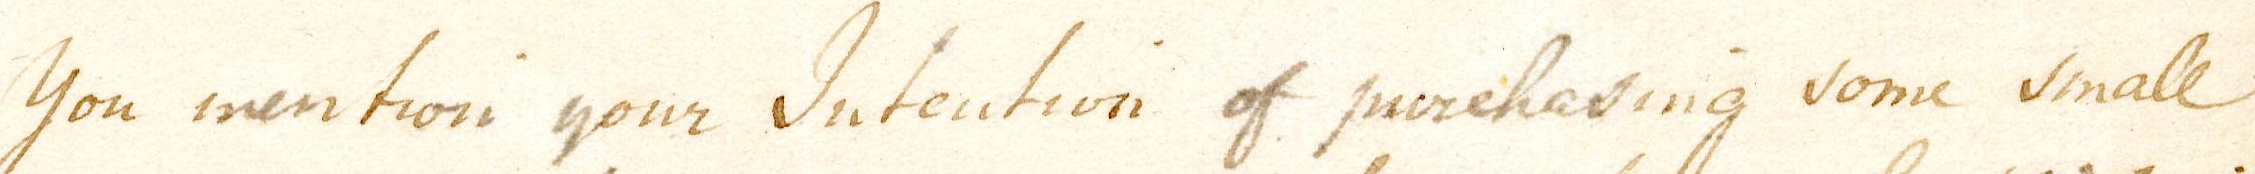You mention your Intention of purchasing some small
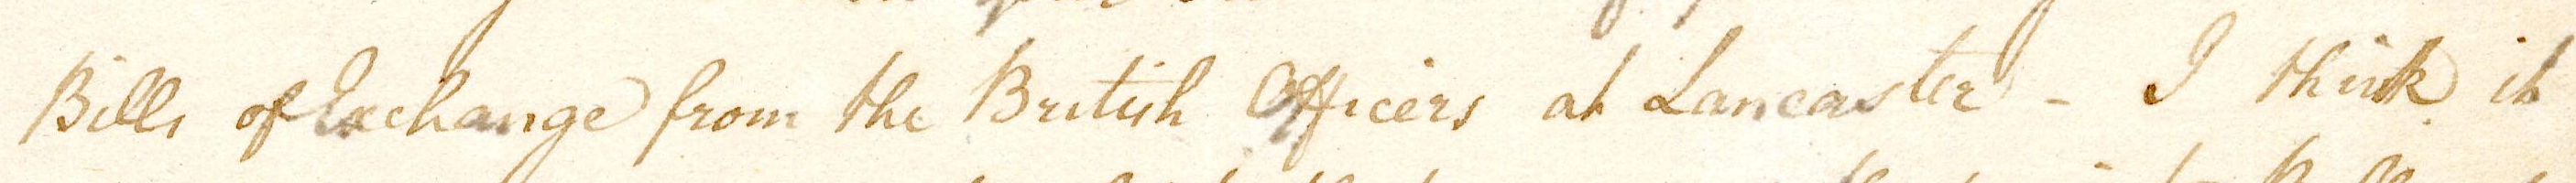Bills of Exchange from the British Officers at Lancaster. I think it
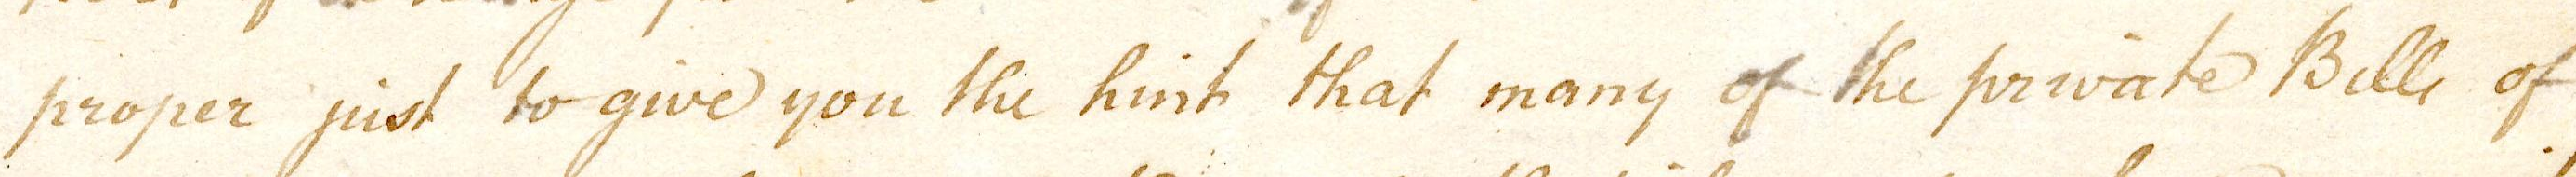proper just to give you the hint that many of the private Bills of
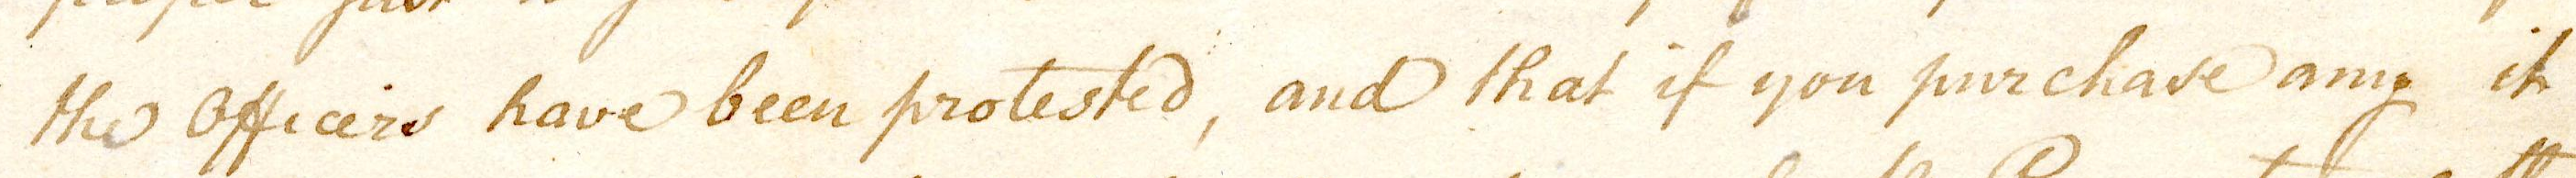the Officers have been protested, and that if you purchase any, it
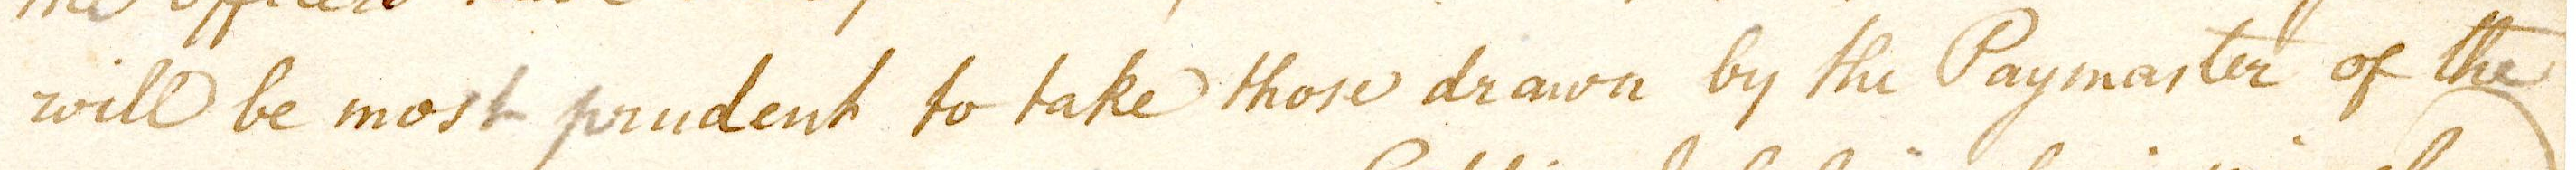will be most prudent to take those drawn by the Paymaster of the
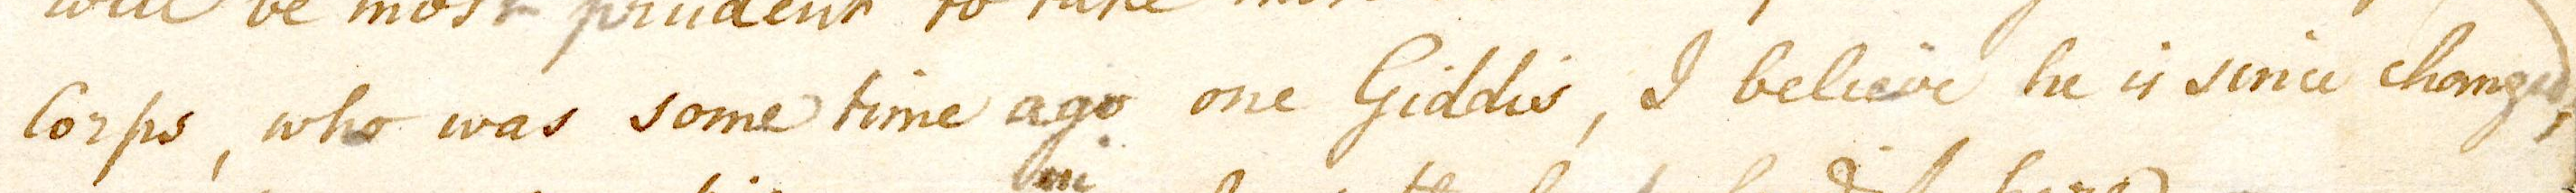Corps, who was some time ago one Giddis, I believe he is since changed,
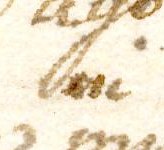in
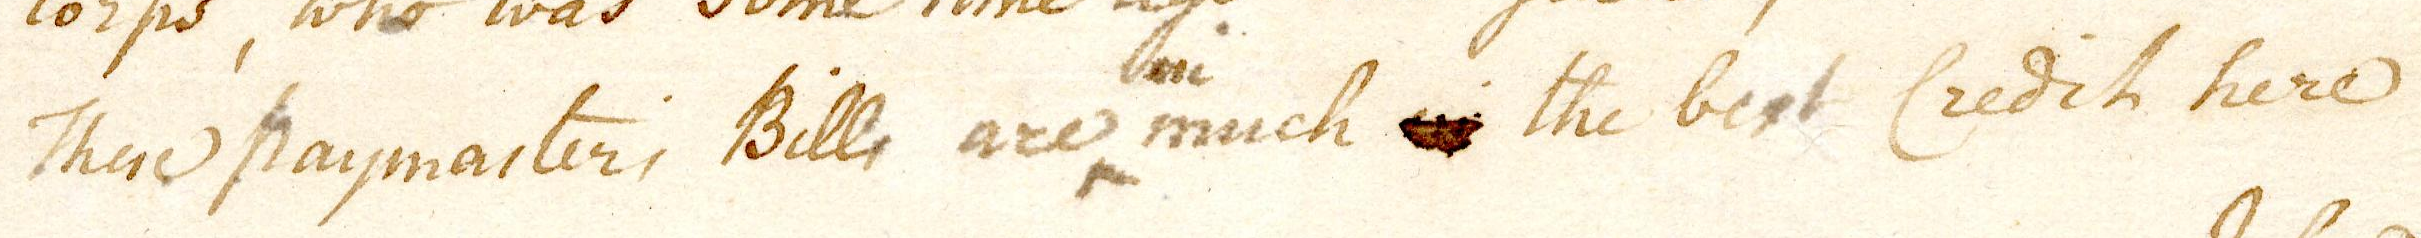These paymasters Bills are ^ much the best Credit here
